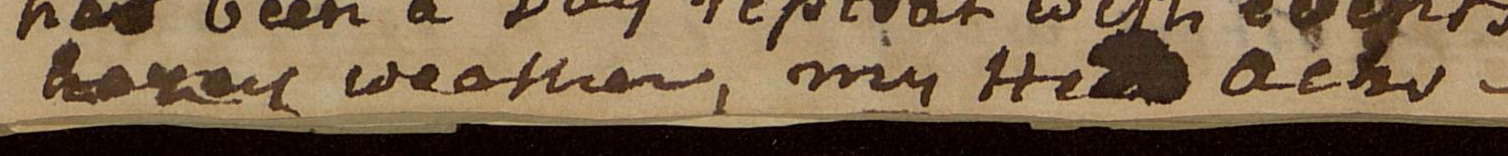hazey weather, my Head Achs -
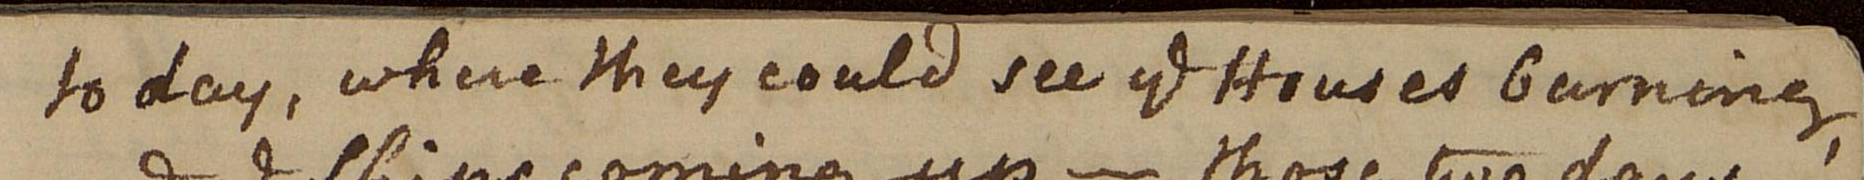to day, where they could see y^e Houses burning,
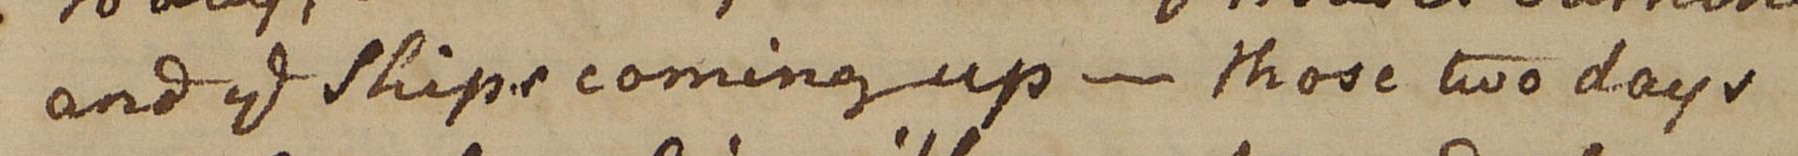and y^e Ships coming up- those two days
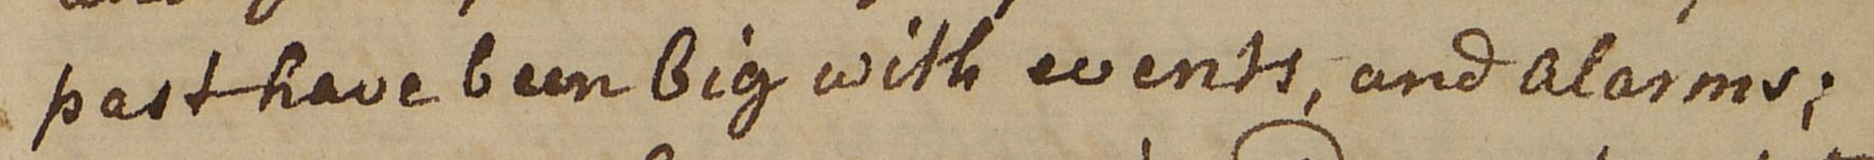past have been big with events, and Alarms;
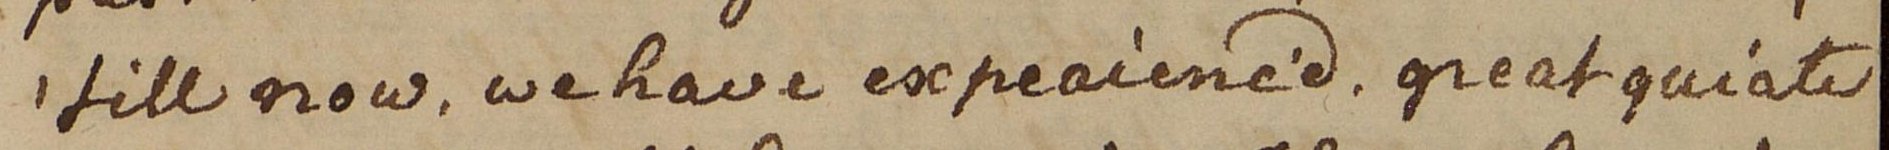'till now, we have expeaienc'd great quiate
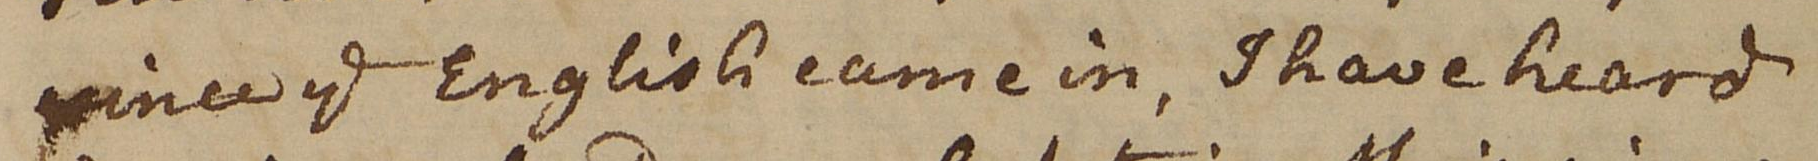[s]ince y^e English came in, I have heard
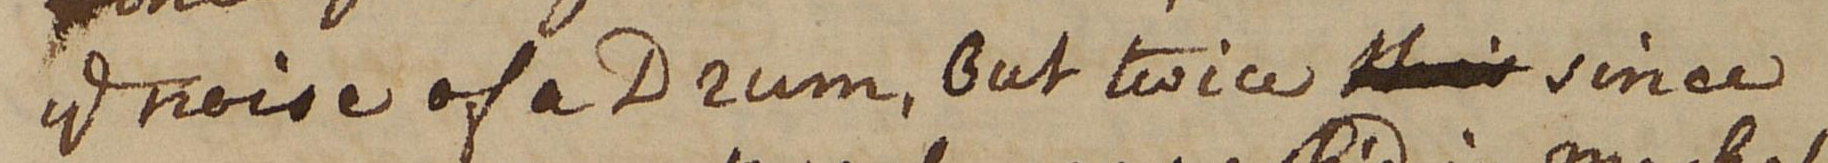y^e noise of a D rum, but twice [this] since
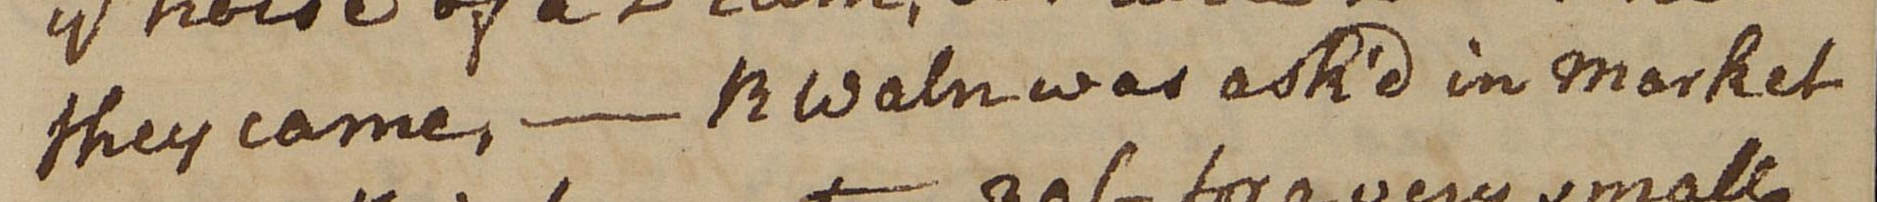they came,- R Waln was ask'd in Market
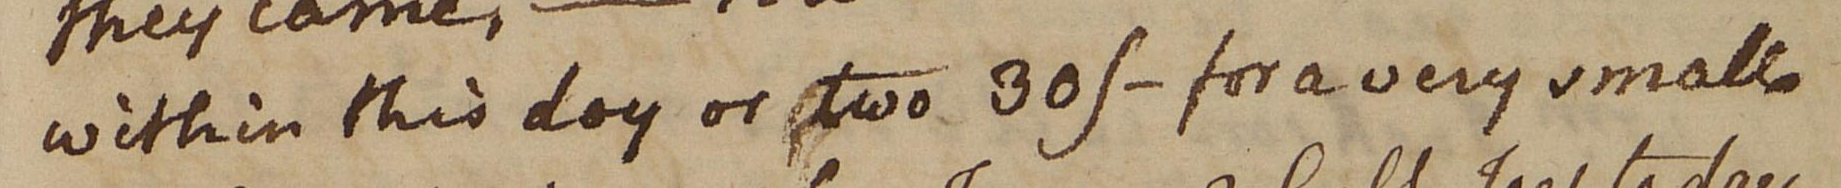within this day or two 30s- for a very small
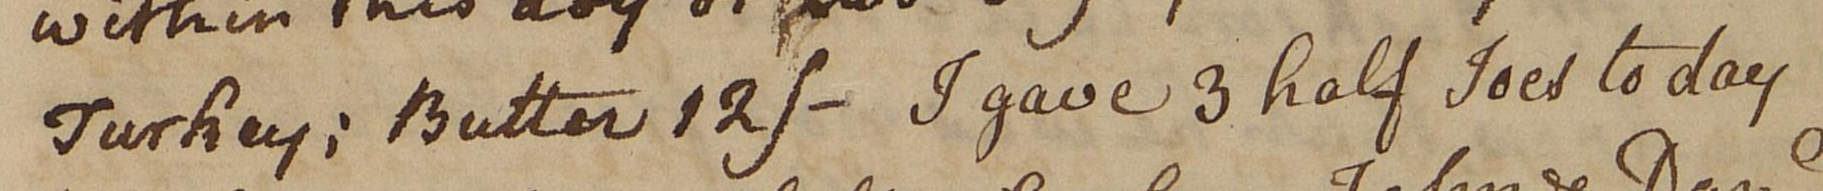Turkey; Butter 12s- I gave 3 half Joes to day
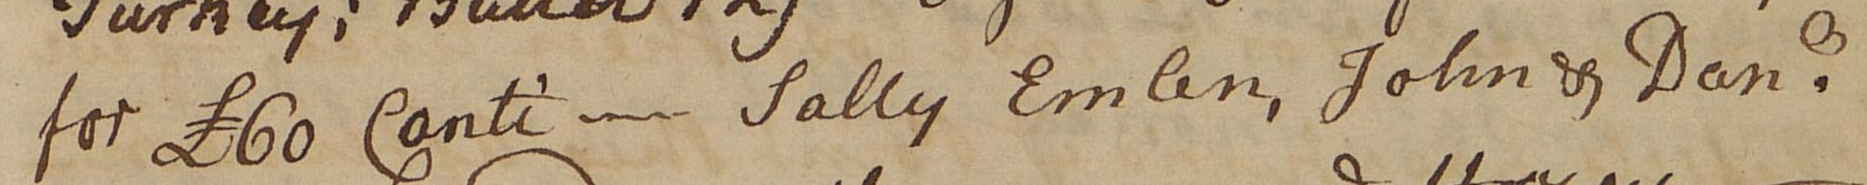for £60 Canti- Sally Emlen, John & Dan^l.
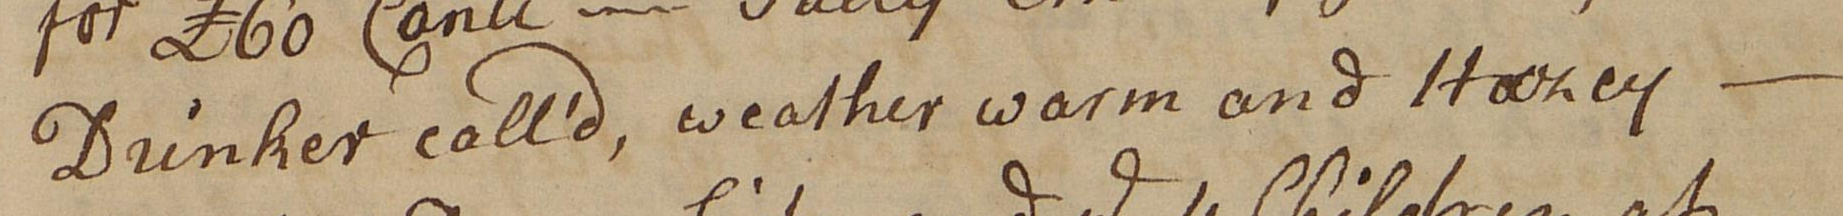Drinker call'd, weather warm and Hazey-
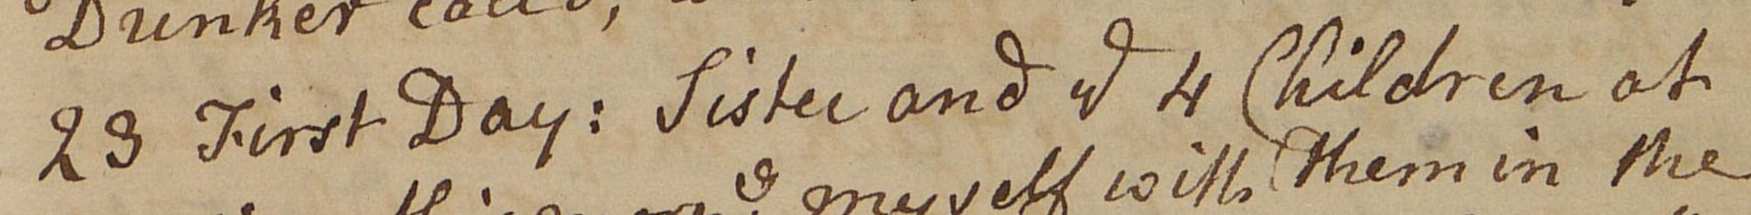23 First Day: Sister and y^e 4 Children at
